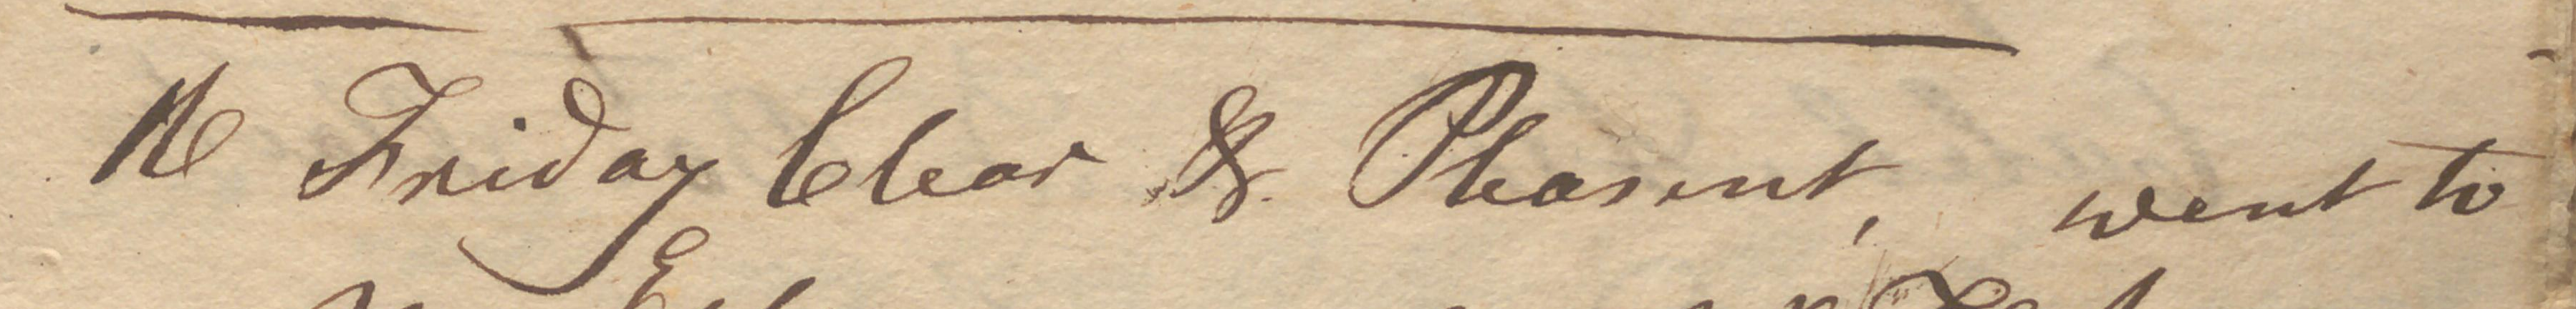16 Friday Clear & Pleasent went to
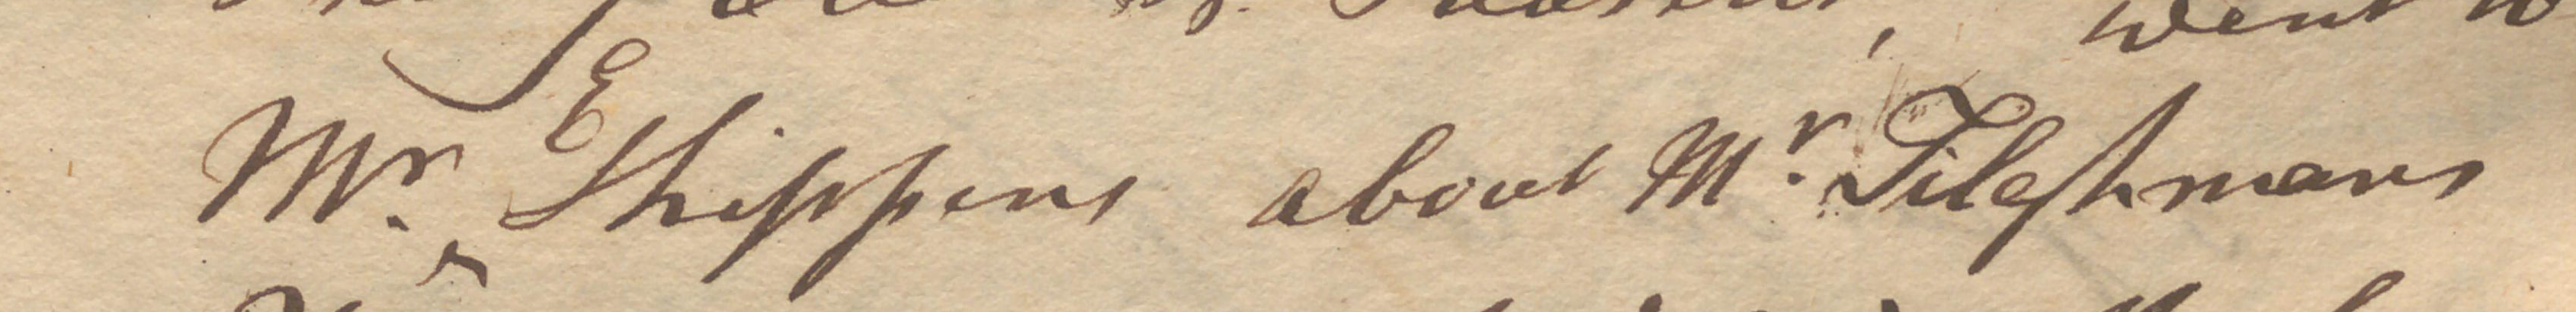M^r. ^E Shippens about M^r. Tilghmans
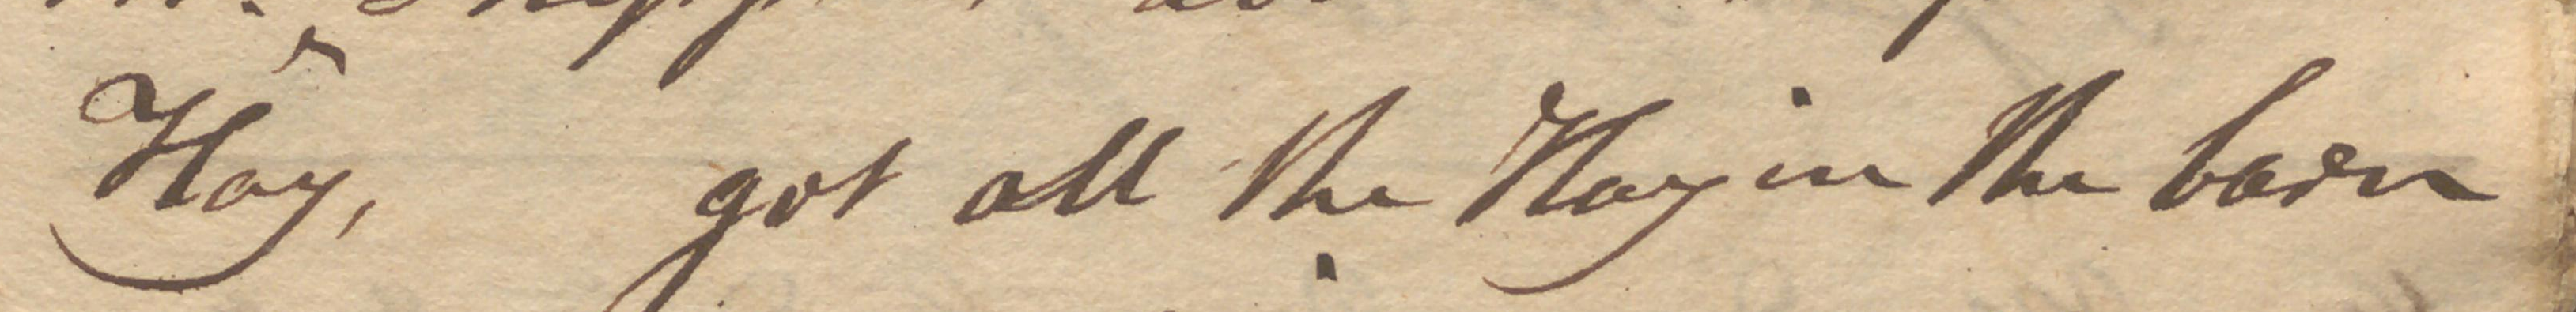Hay, got all the Hay in the barn
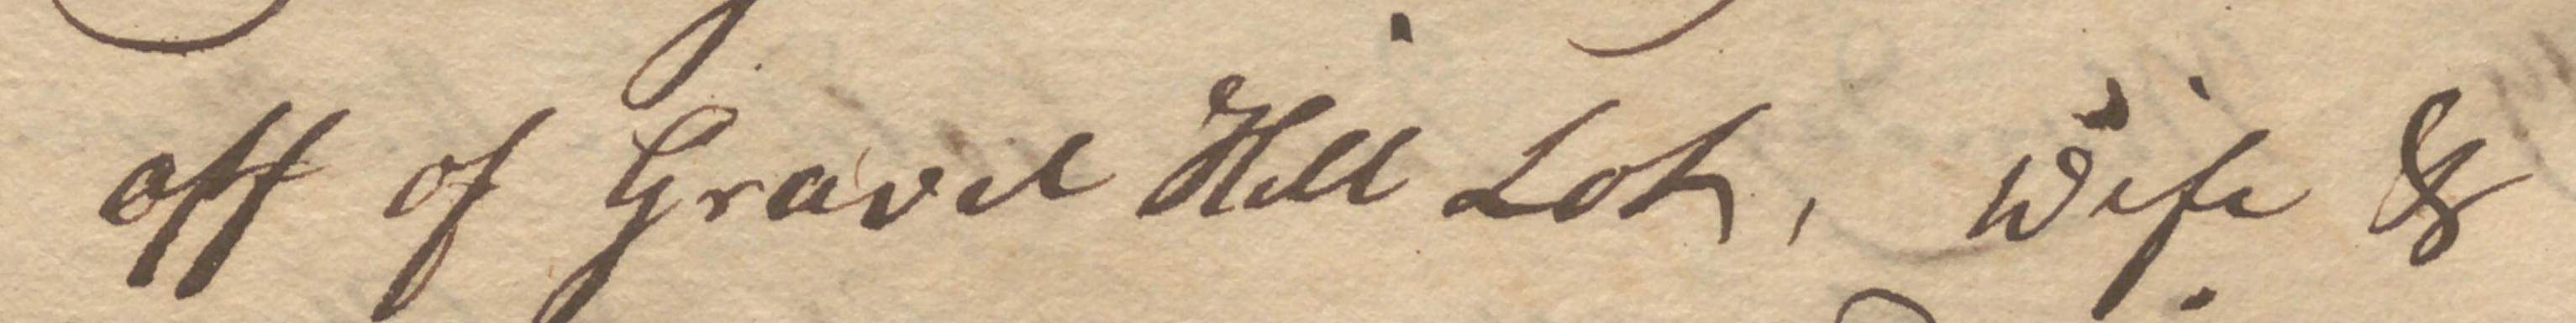off of Gravel Hill Lot, wife &
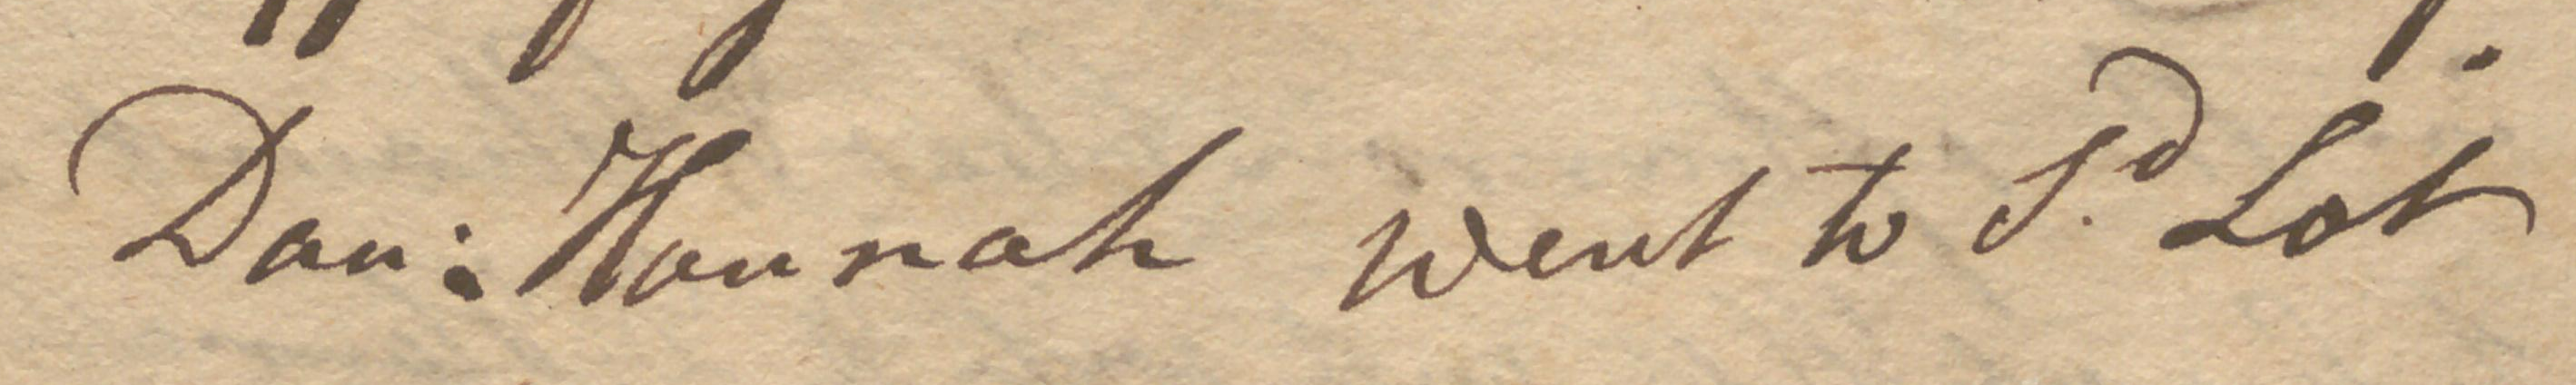Dau^r: Hannah went to s^d. Lot
